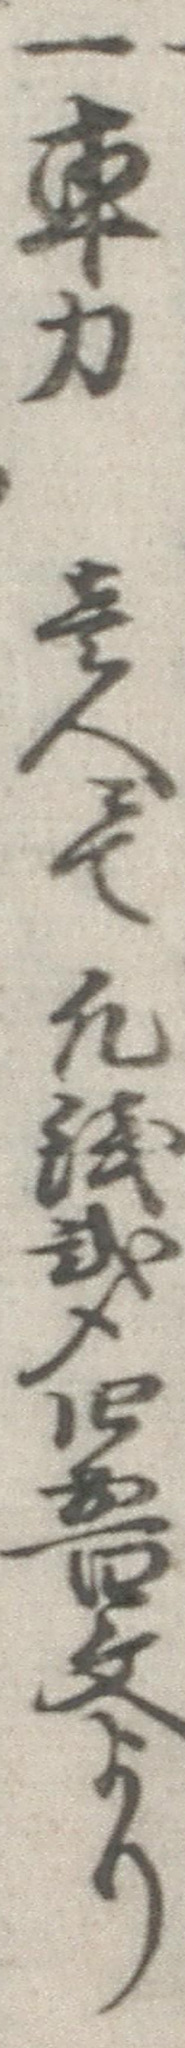一車力壱人にて凡銭弐貫四五百文より
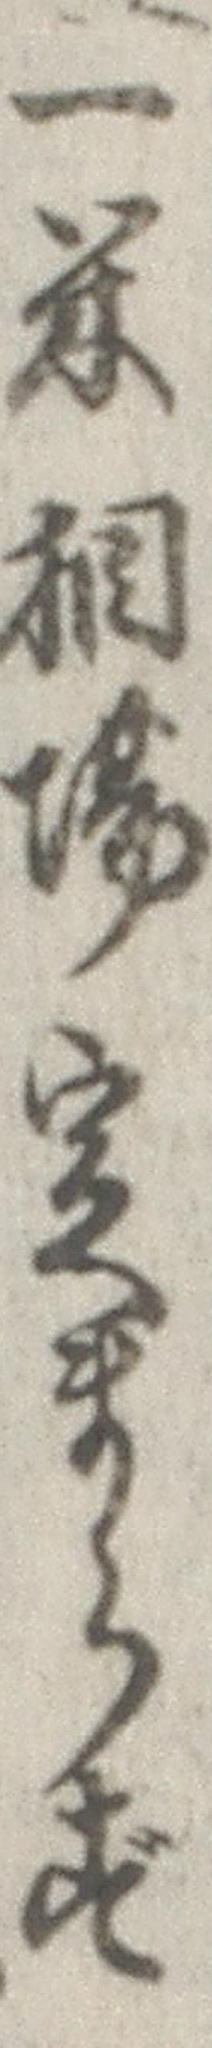一米相場定まらず
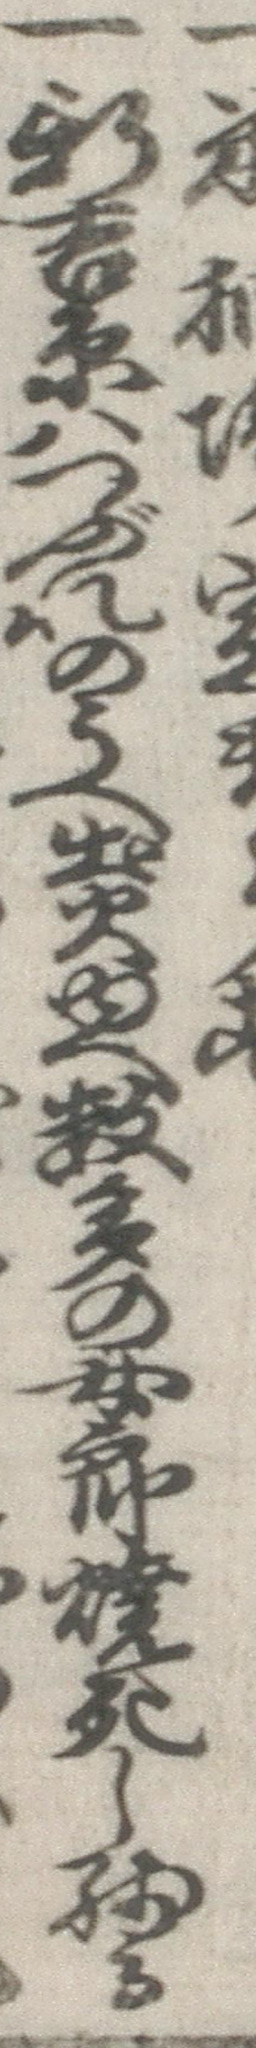一新吉原はつぶれのうへ出火ゆへ数多の女郎焼死し残る
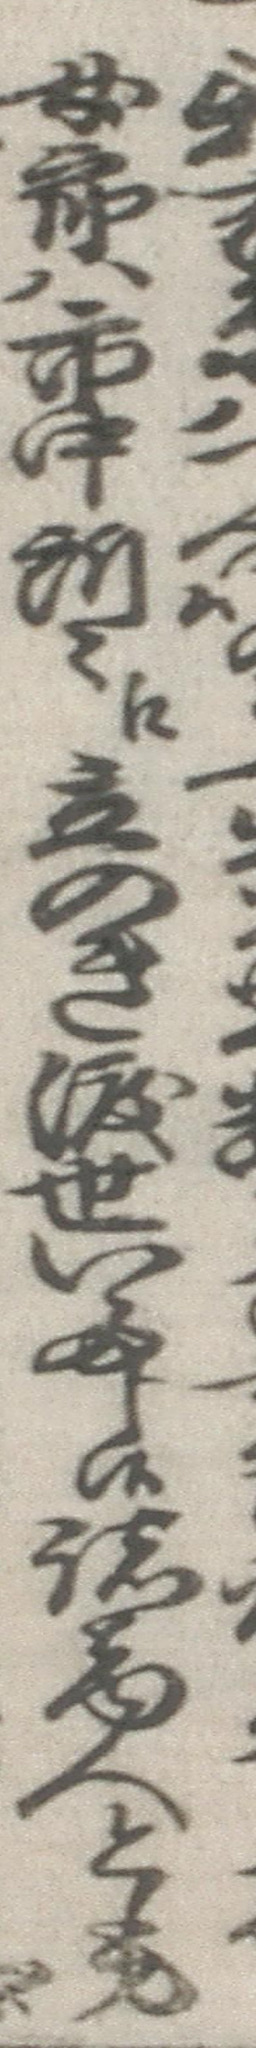女郎は市中所〻江立のき渡世いたし候諸商人とも
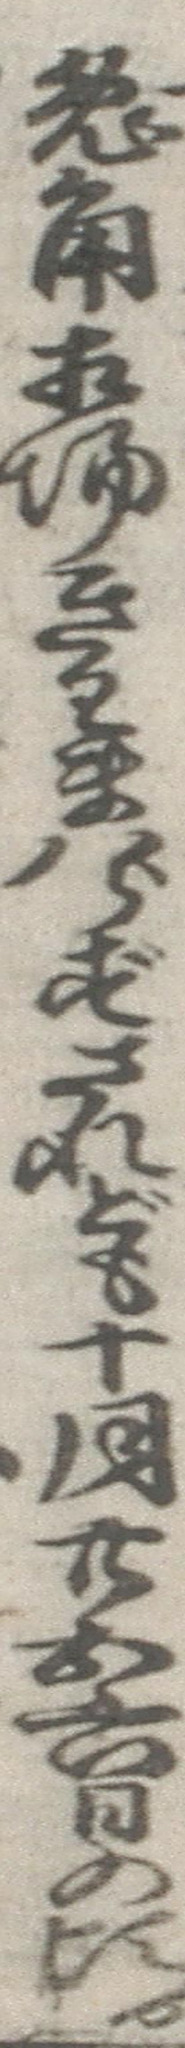兎角相場きわまらずされども十月廿五六日の頃ゟ
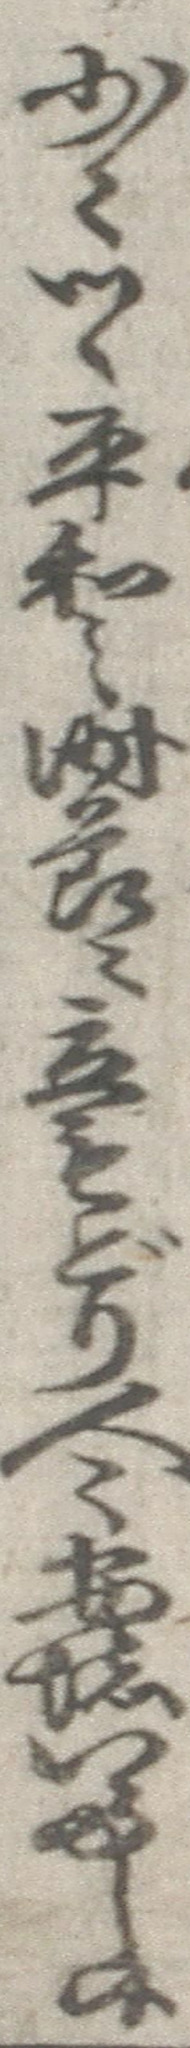少〻ツヽ平和之時節に立もどり人〻安堵致し候
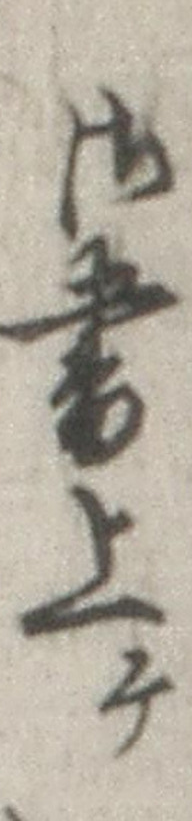御書上ケ
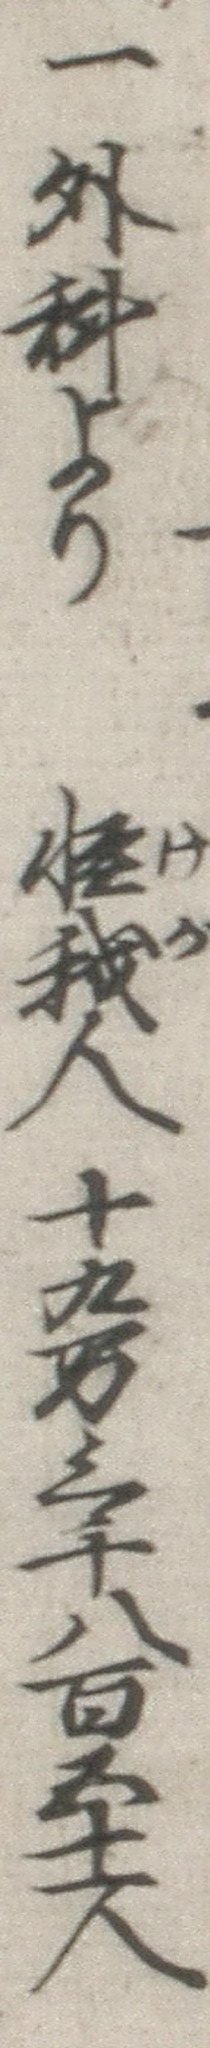一外科より怪我人十九万三千八百五十一人
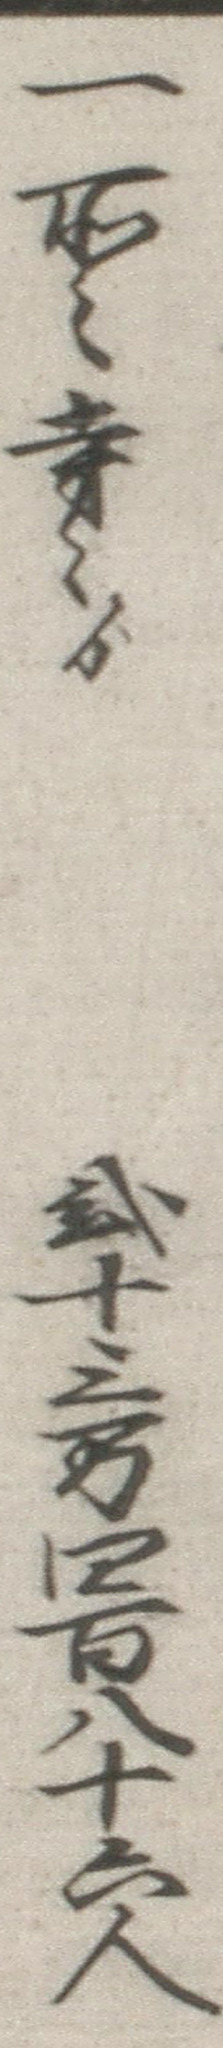一所〻寺〻ゟ弐十三万四百八十六人
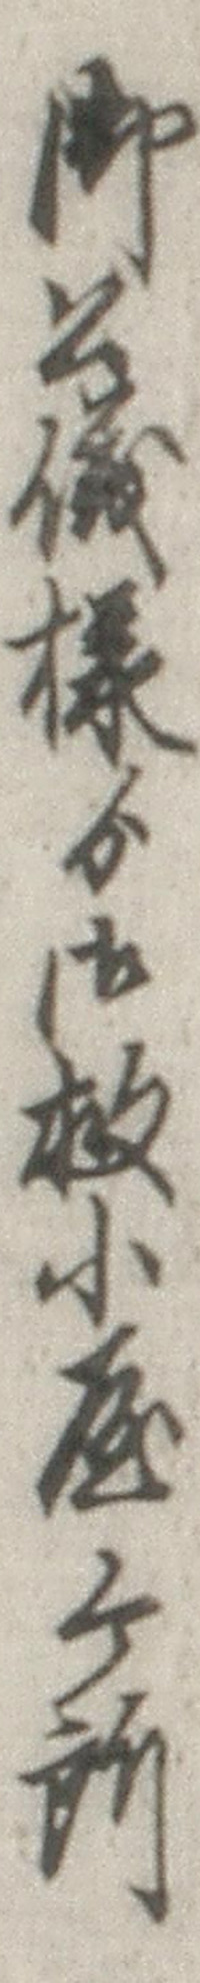御公儀様ゟ御救小屋ケ所
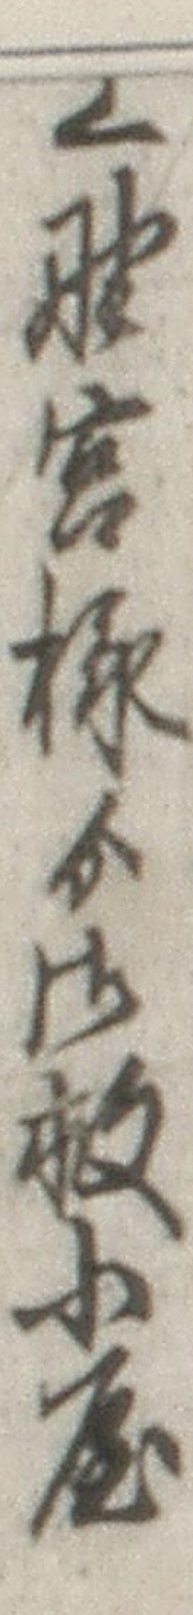野宮様ゟ御救小屋
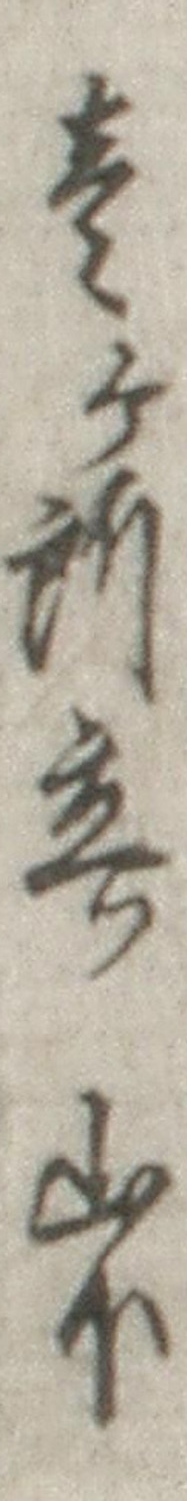壱ケ所立ツ山下

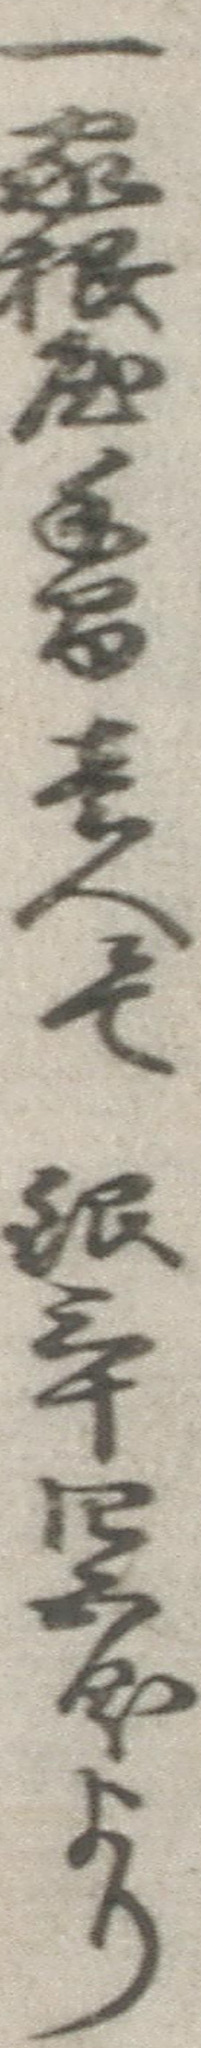一家根屋手間壱人にて銀三十四五匁より
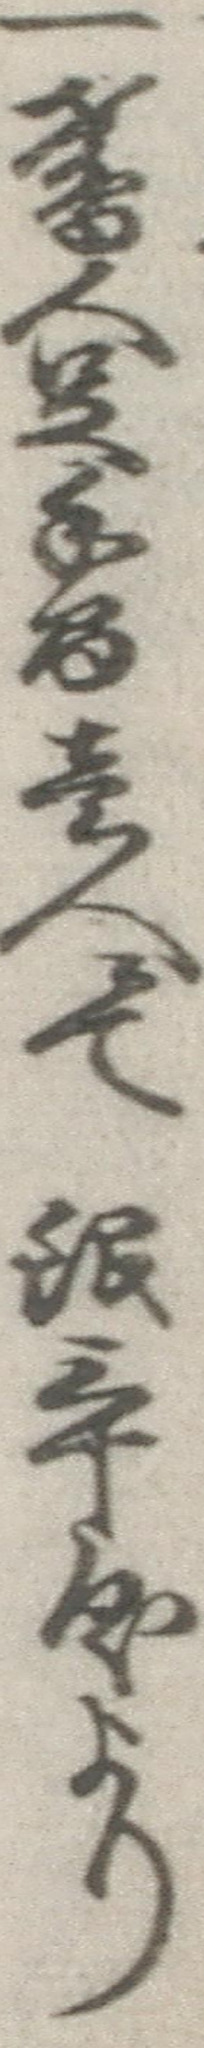一鳶人足手間壱人にて銀三十匁より
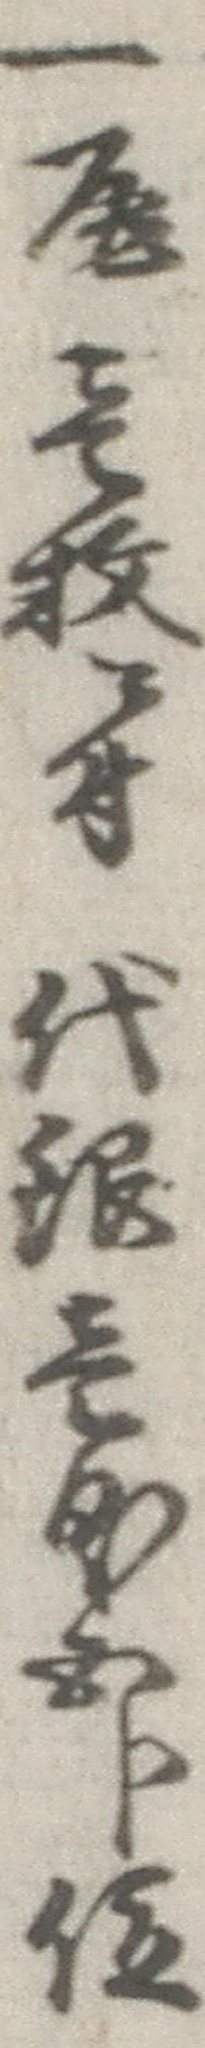一瓦壱枚に付代銀壱匁五分位
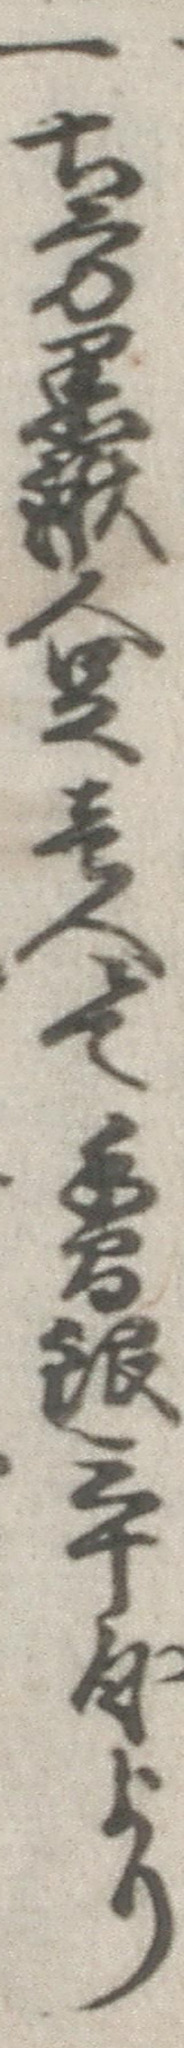一土方黒鍬人足壱人にて手間銀三十匁より
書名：大地震焼場細見記
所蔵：東京大学地震研究所図書室 Earthquake Research Institute Library, The University of Tokyo, JAPAN
